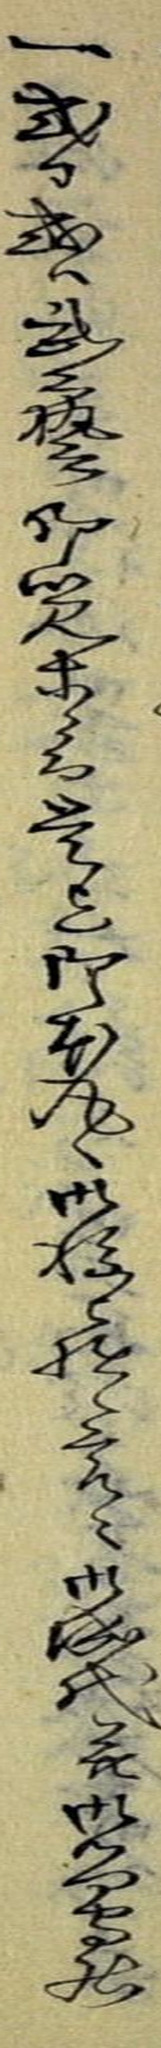一式日或ハ武芸御覧等ニ而是迄御本丸へ御移被遊候節ニ御城代并御留守居
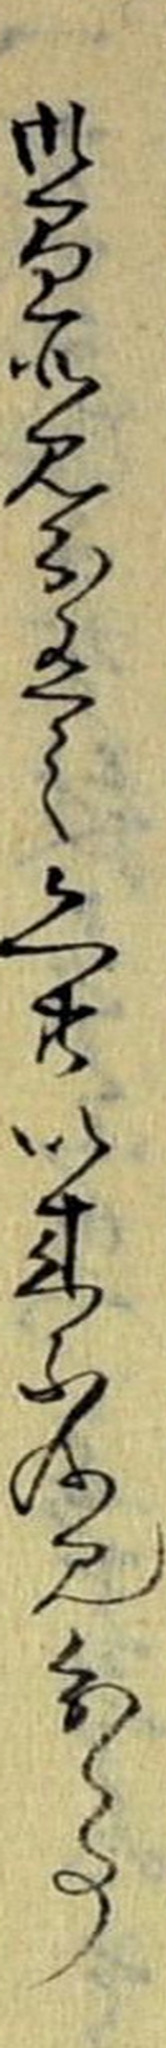御間所見分有之候へ共以来不及見分事
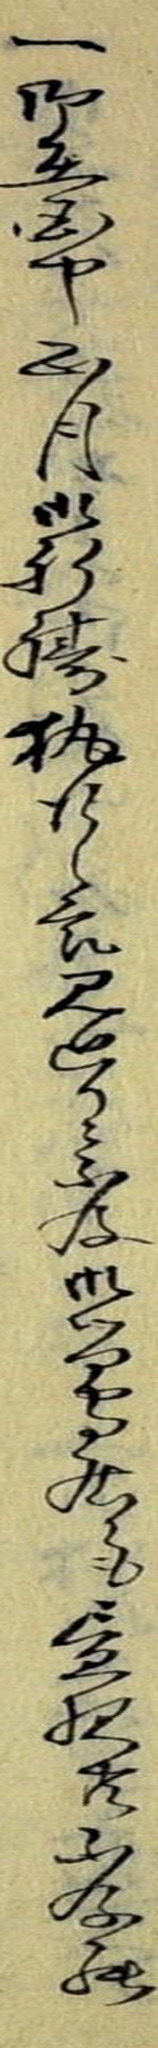一御在国中正月御祈祷執行之節見廻りニ不及御留守居も昼夜共不及罷
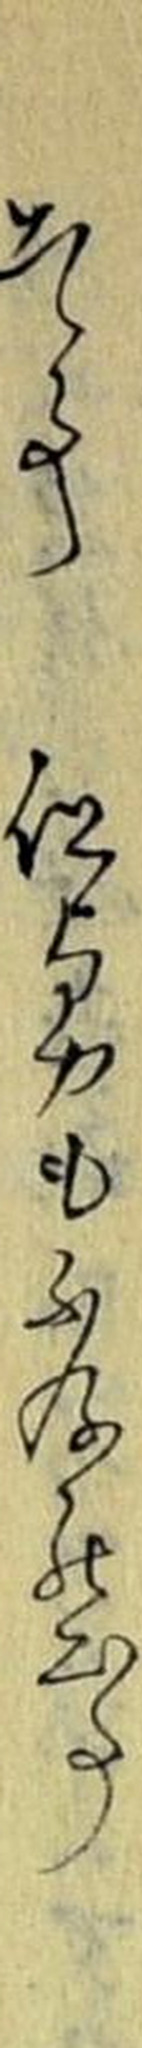出候事但与力も不及罷出事
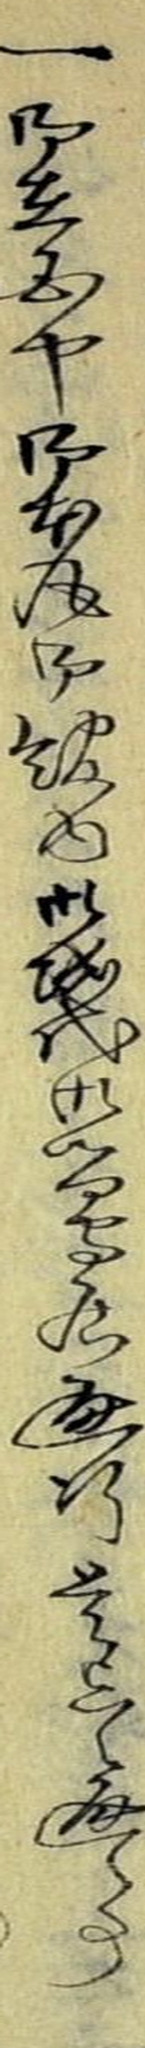一御在国中御本丸御館内御城代御留守居通行是迄之通之事
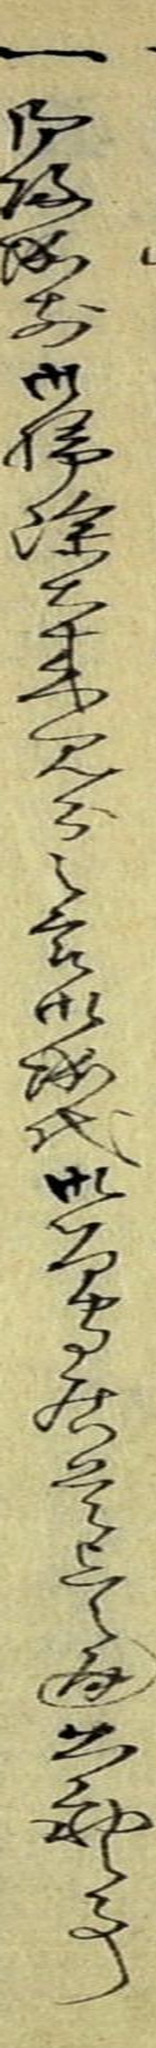一御帰城前御掃除出来見分之節御城代御留守居是迄之通出勤候事
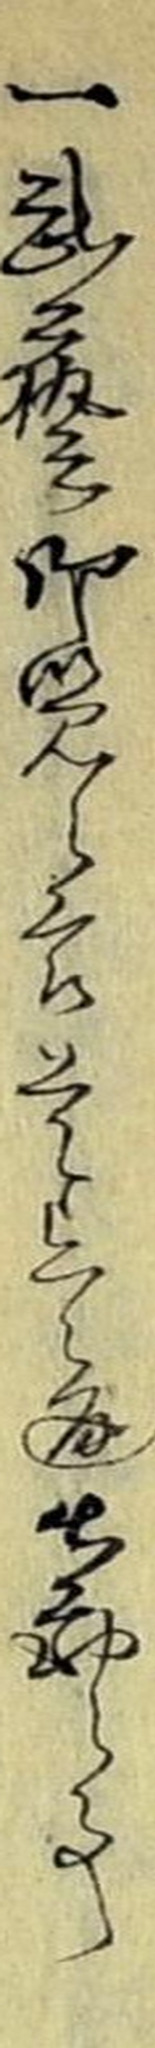一武芸御覧之節是迄之通出勤之事
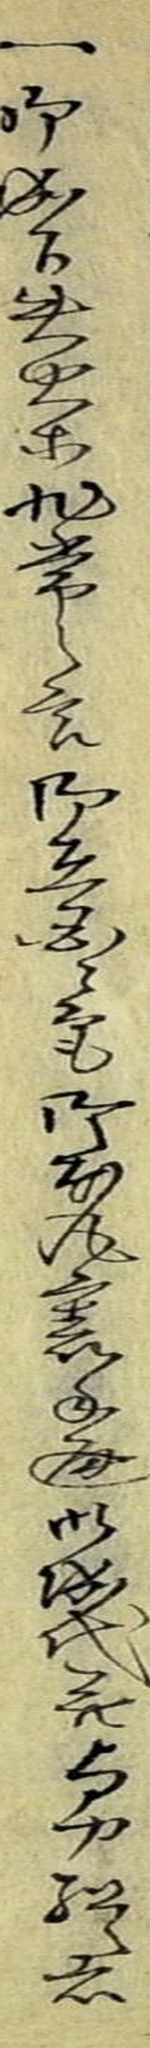一御城下失火等非常之節御在国ニ而も御本丸裏手通御城代并与力組之者
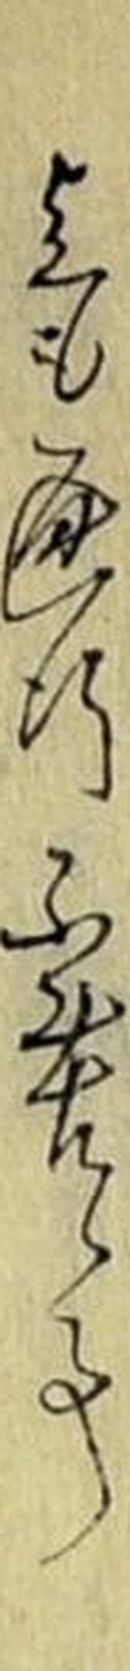迄も通行不苦候事
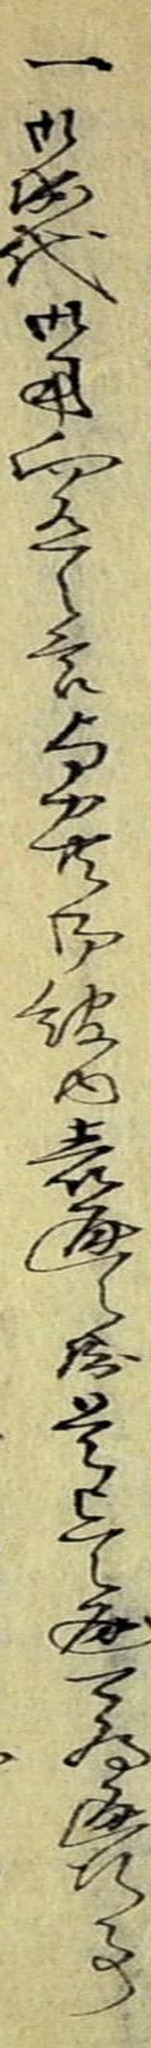一御城代御用向有之節与力共御館内表通之儀是迄之通可為通行事
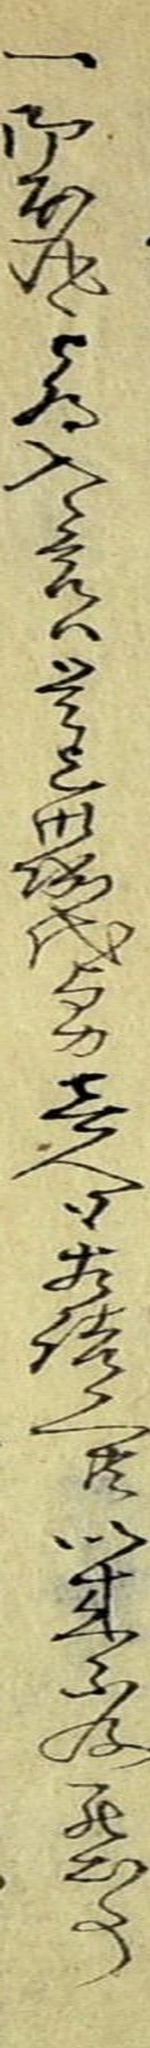一御本丸へ被為入候節ハ是迄御城代与力壱人ツヽ相詰候へ共以来不及罷出事
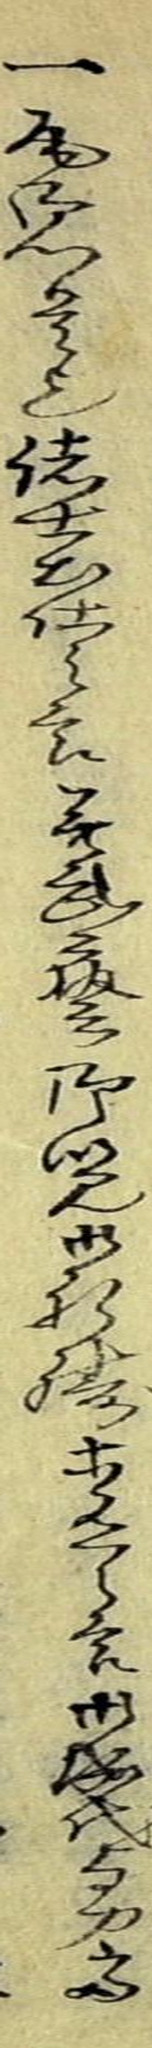一瓦御門是迄諸士出仕之節并武芸御覧御祈祷等有之節御城代与力当
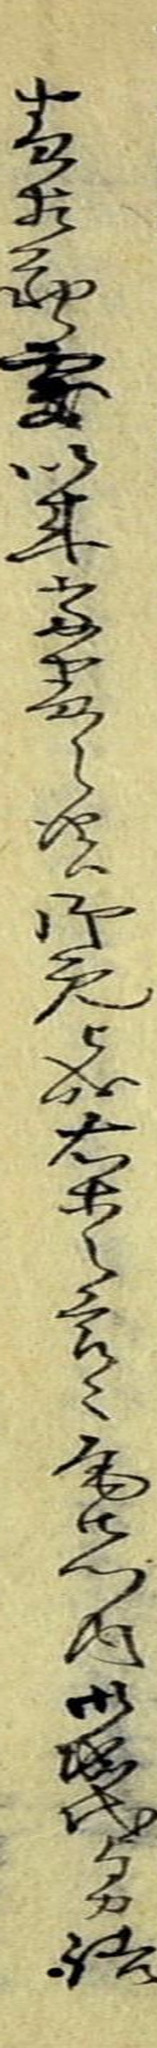番相勤候処以来当番之儀ハ御免被成右等之節ニ瓦御門内御城代与力詰
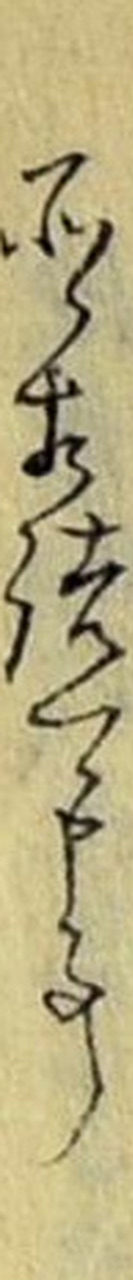処へ相詰可申事
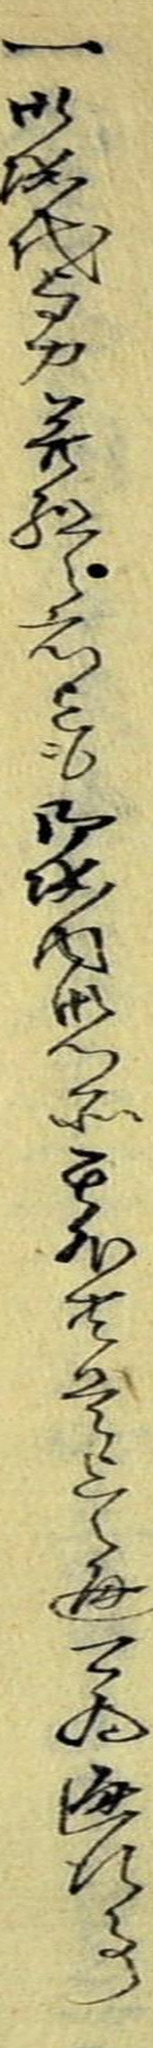一御城代与力并組之者迄も御城内御門所其外共是迄之通可為通行事

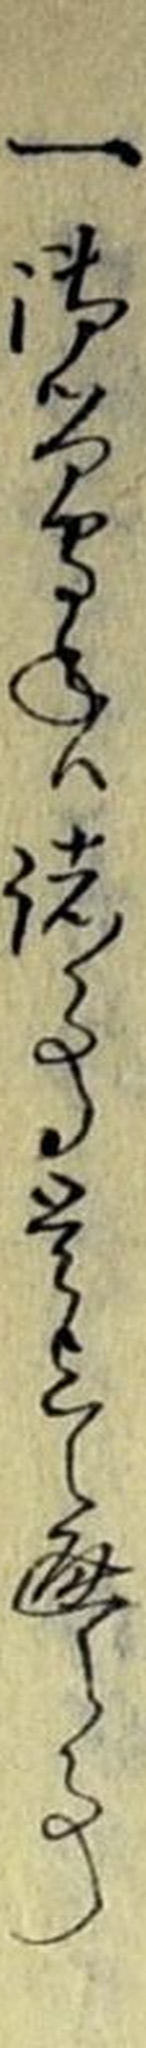一御留守年ハ諸事是迄之通之事
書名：命令之部 五
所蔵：福井県文書館 Fukui Prefectural Archives
